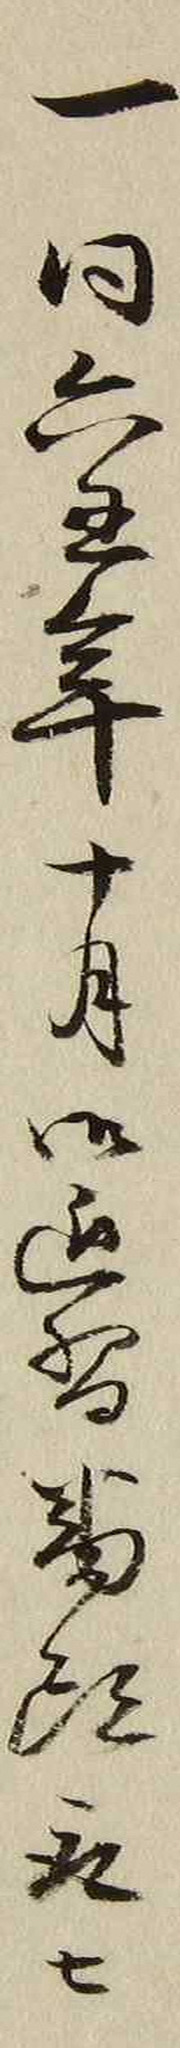一同六丑年十月御近習番頭取被
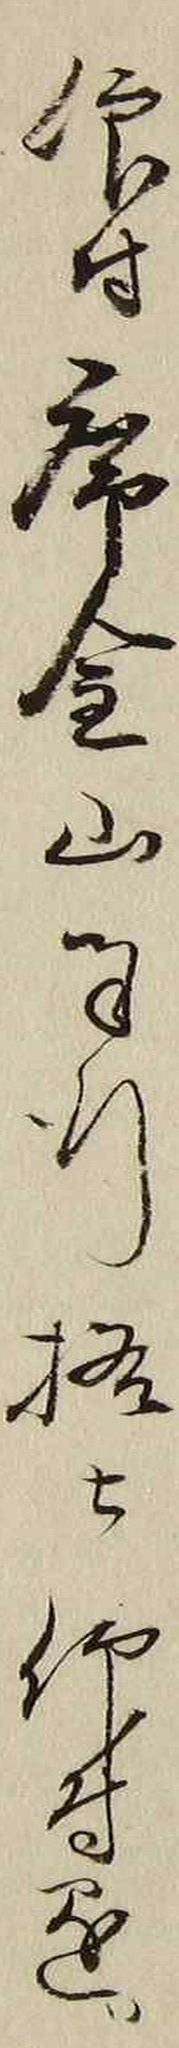仰付席金山奉行格被仰付懸り
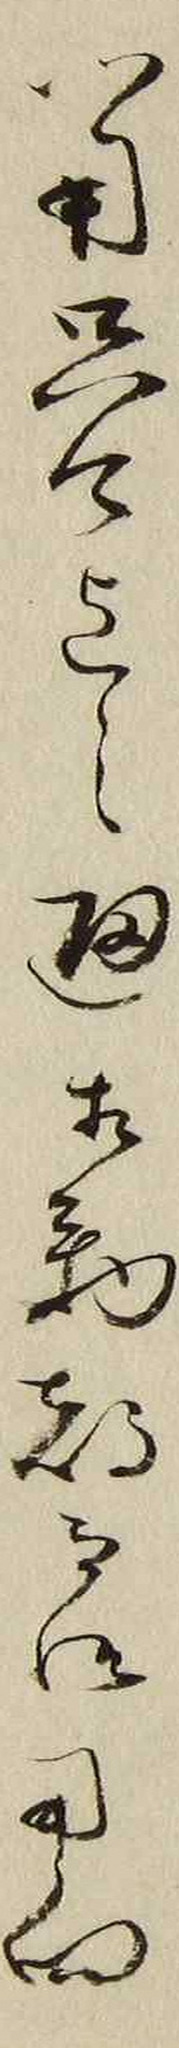御用只今迄之通相勤都而御用向
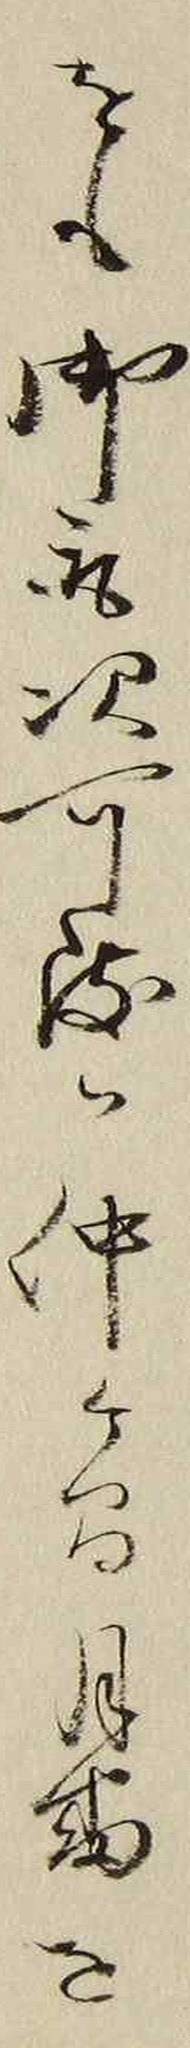をも御取次可致候仲け間月番を
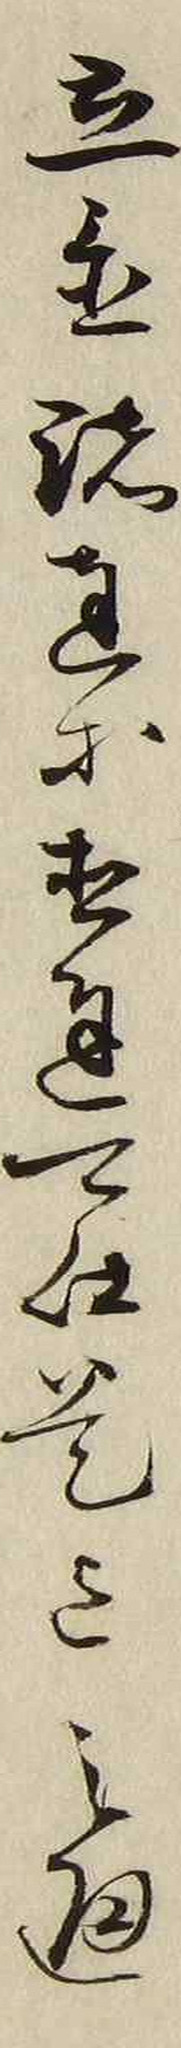立置諸達等直達可仕是迄之通
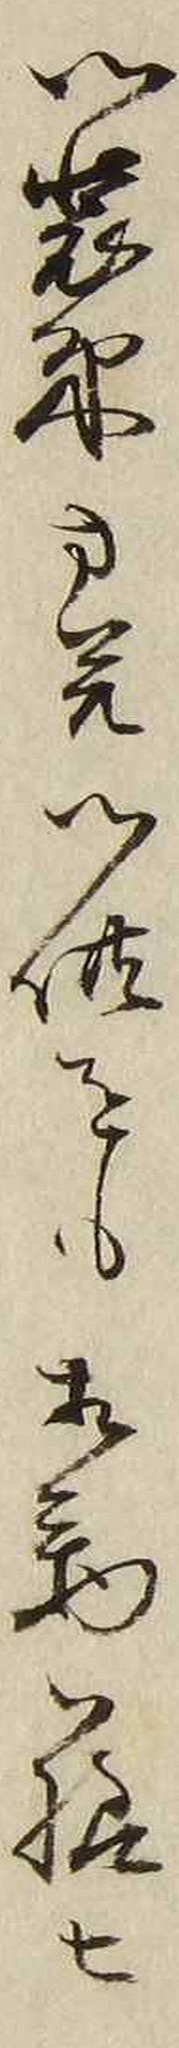御装束方并御供をも相勤候様被

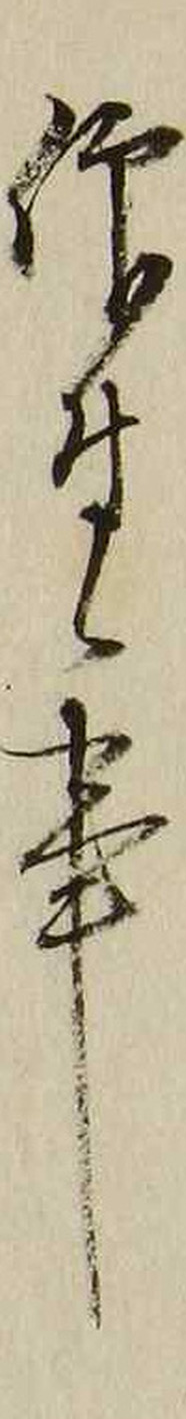仰付候事
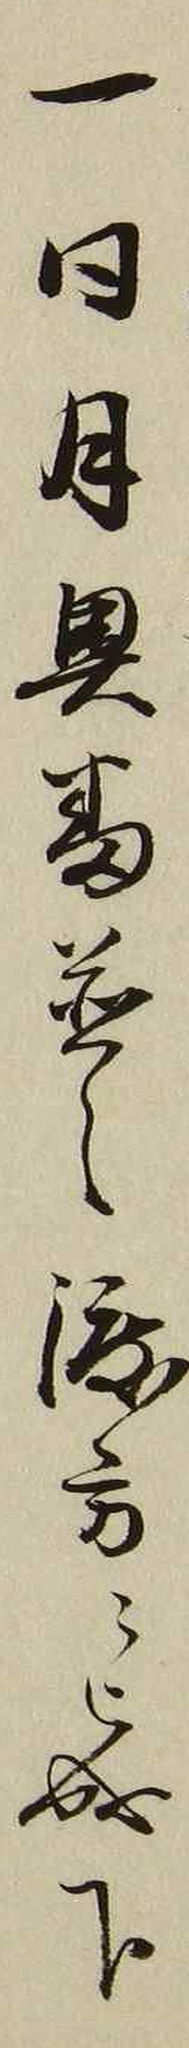一同月奥番並之渡方に被成下
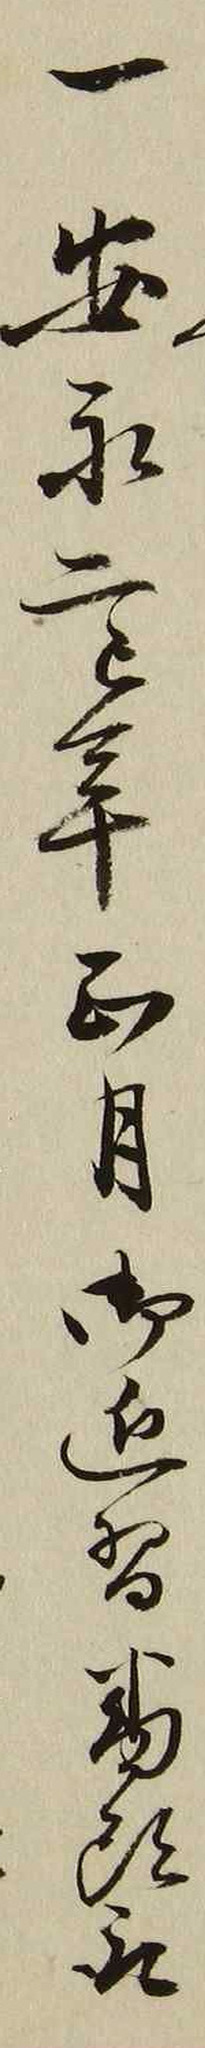一安永二巳年正月御近習番頭取
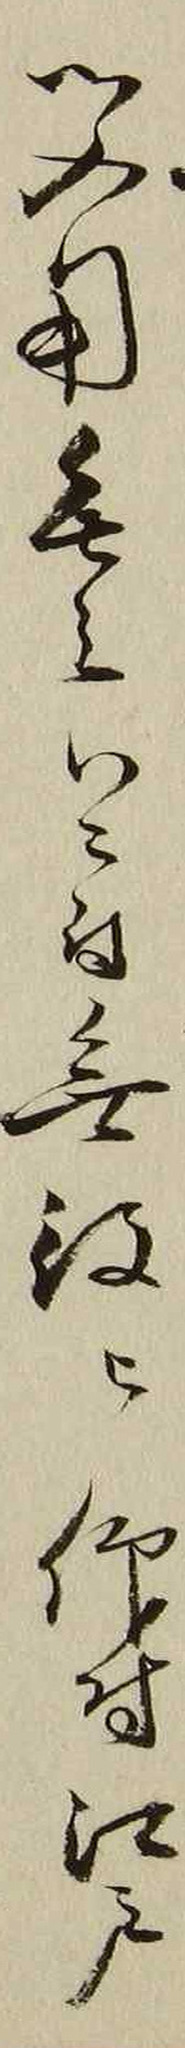御入用無之候に付無役被仰付江戸
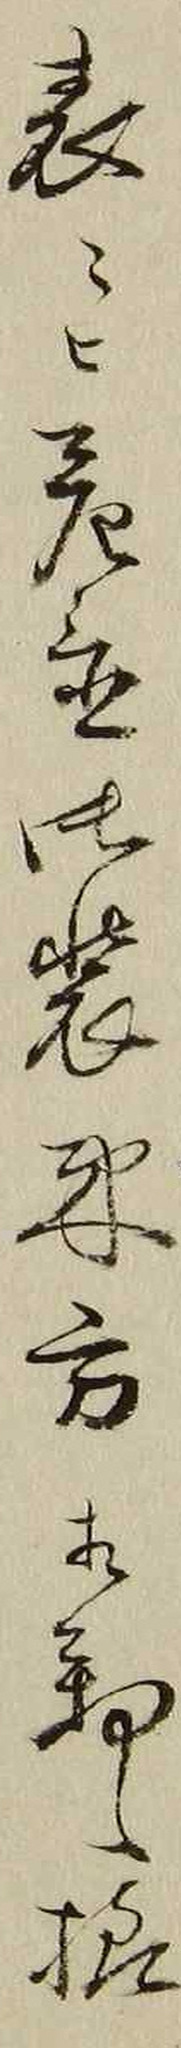表に被差置御装束方相勤候様
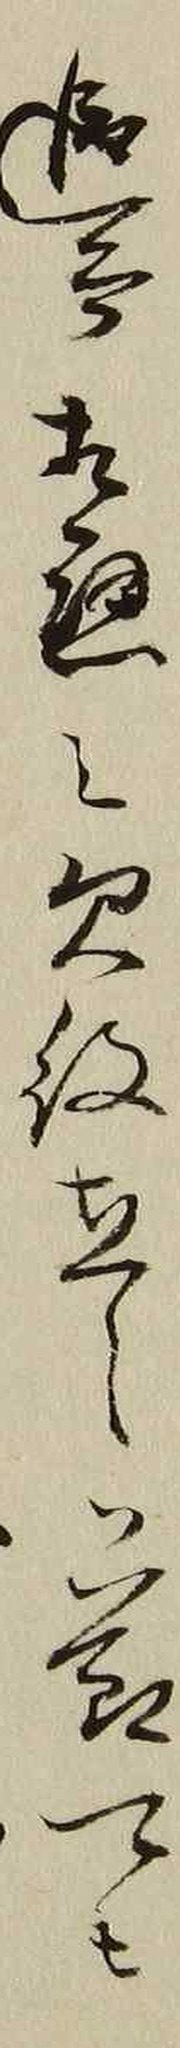追而相応之欠役在之候節可被
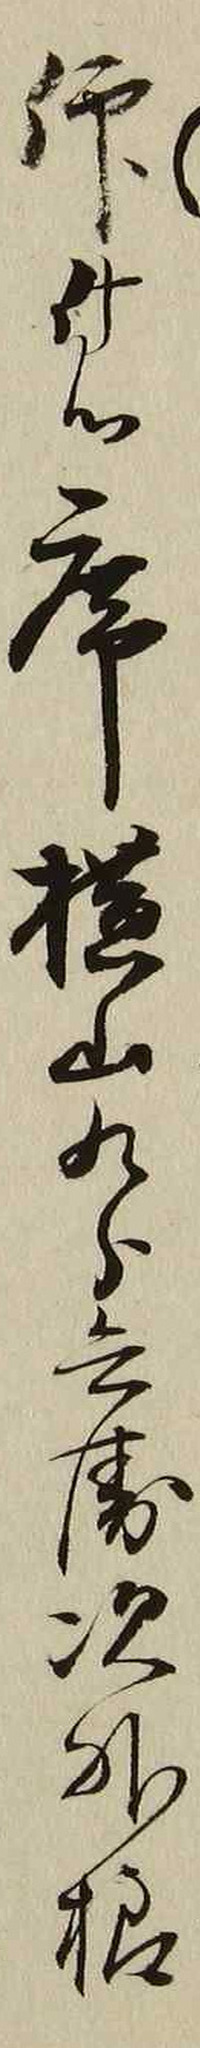仰付候席横山九郎兵衛次外様
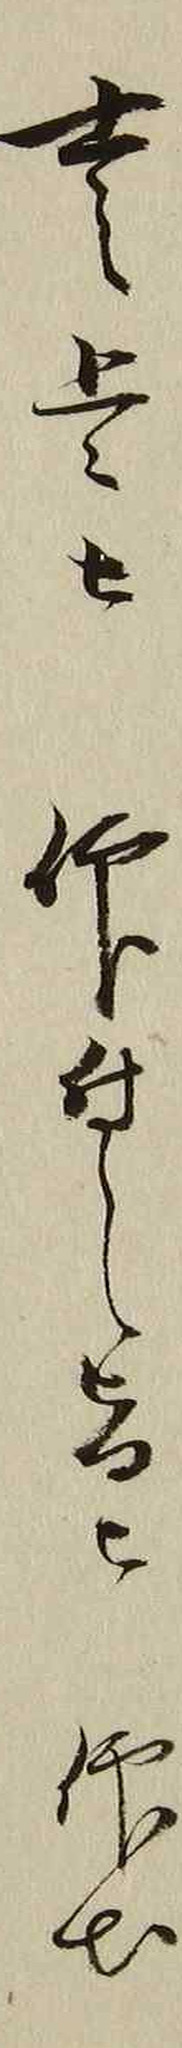士之上に被仰付之旨被仰出
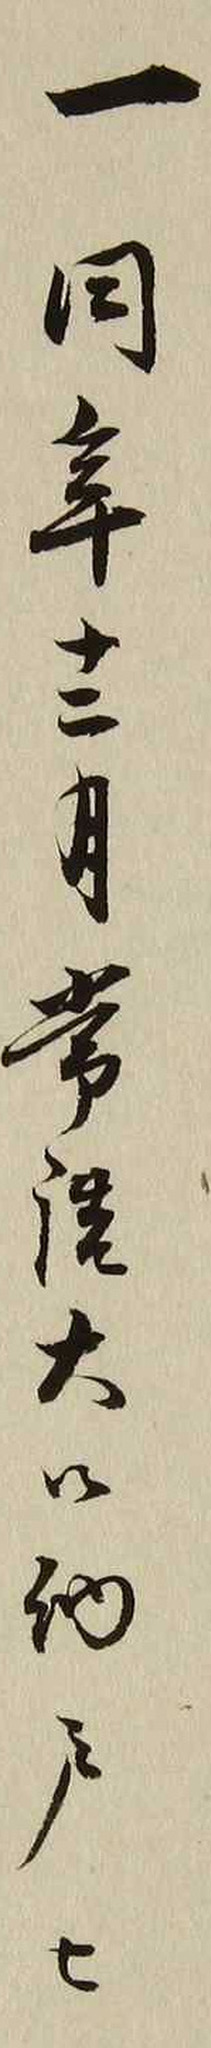一同年十二月常詰大御納戸被
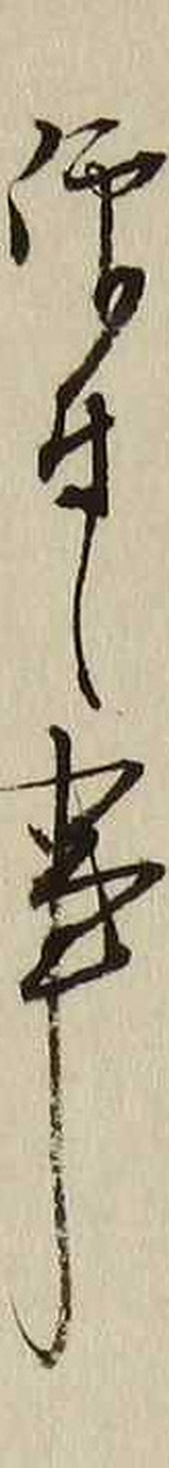仰付候事
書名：諸士系譜　巻之292　き之部1
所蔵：会津若松市立会津図書館
